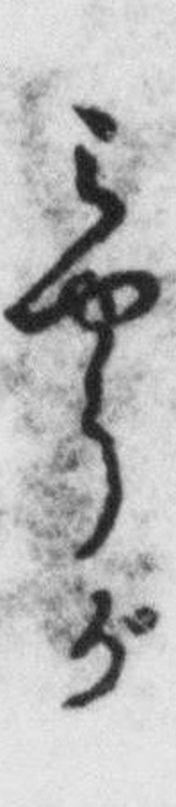みやうが

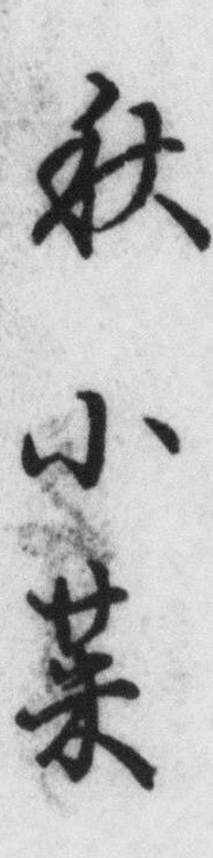秋小菜
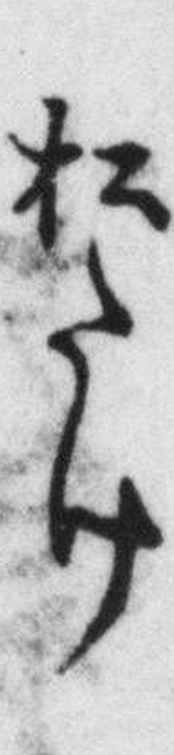松たけ

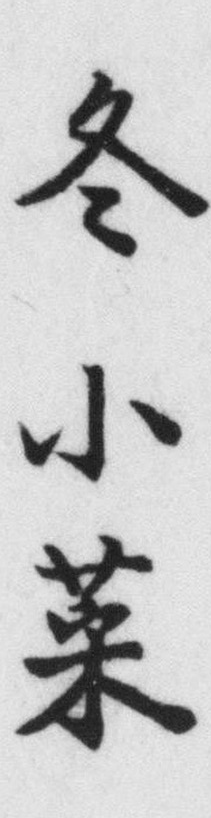冬小菜
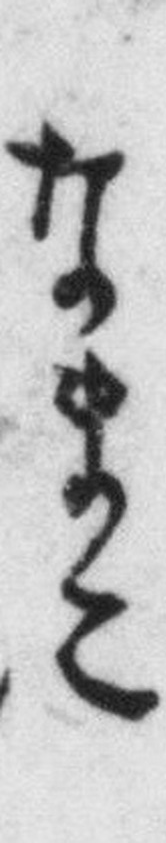なまこ
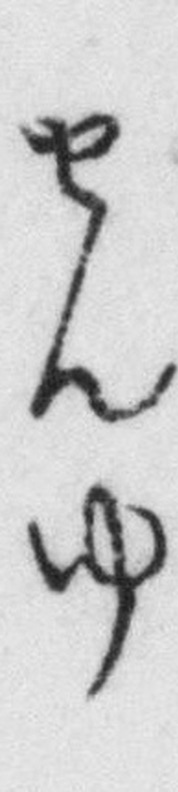せんゆ

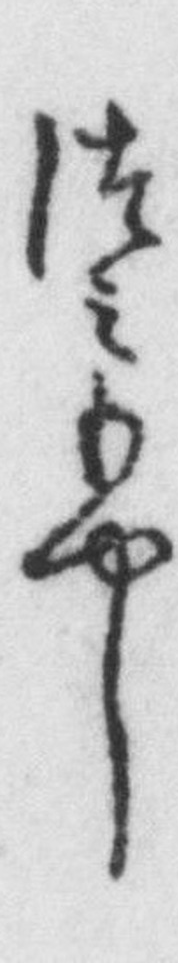つみもやし
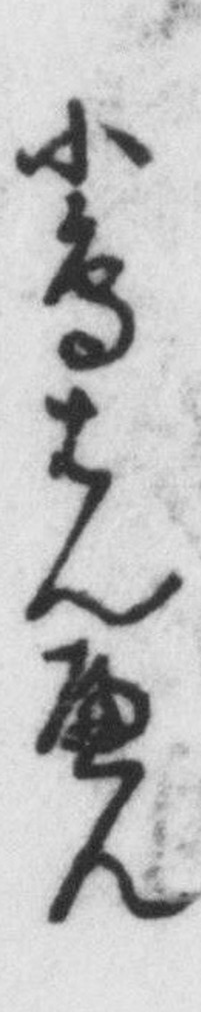小鳥はんへん
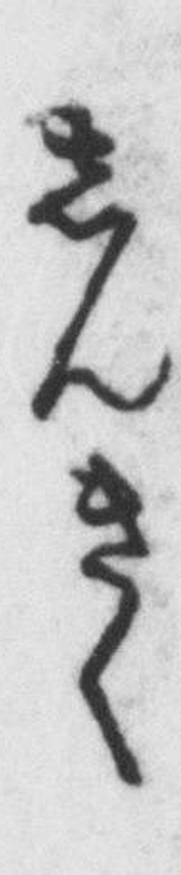しんきく
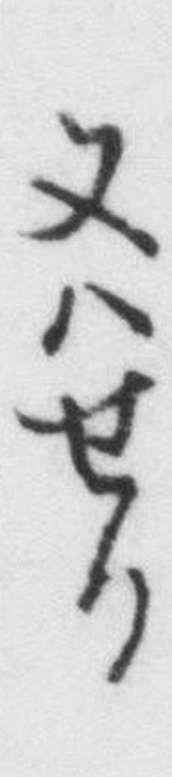又はせり
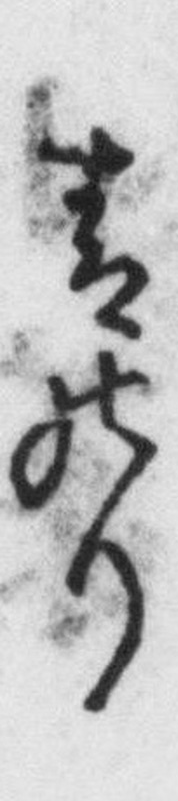青のり

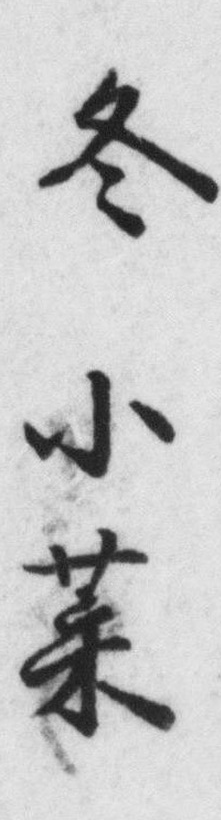冬小菜
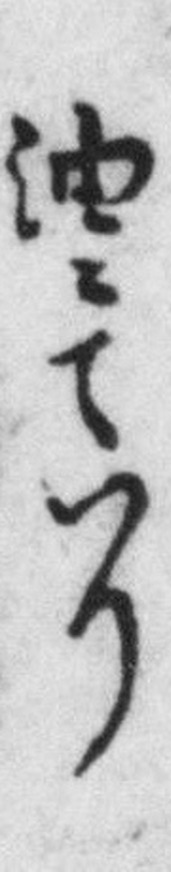油にていり
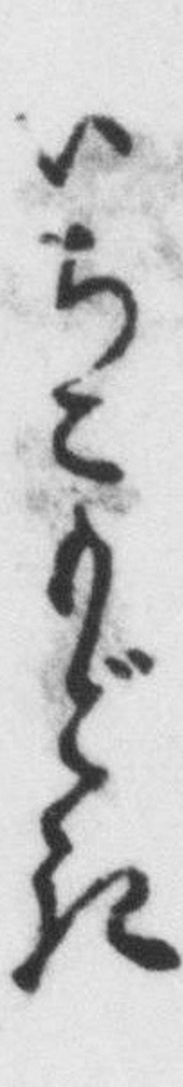いちこもどき

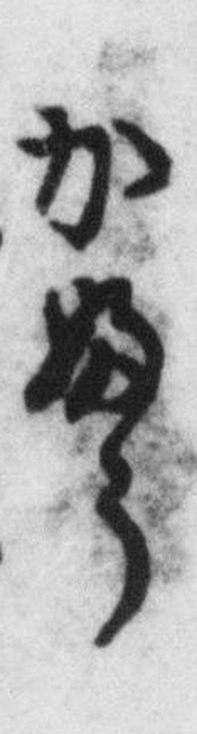かふら
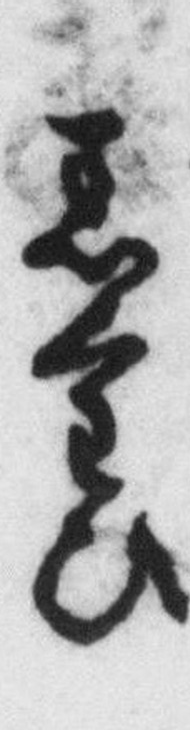黒くわひ
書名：卓子料理仕様
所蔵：大阪府立大学学術情報センター 国文学研究資料館
